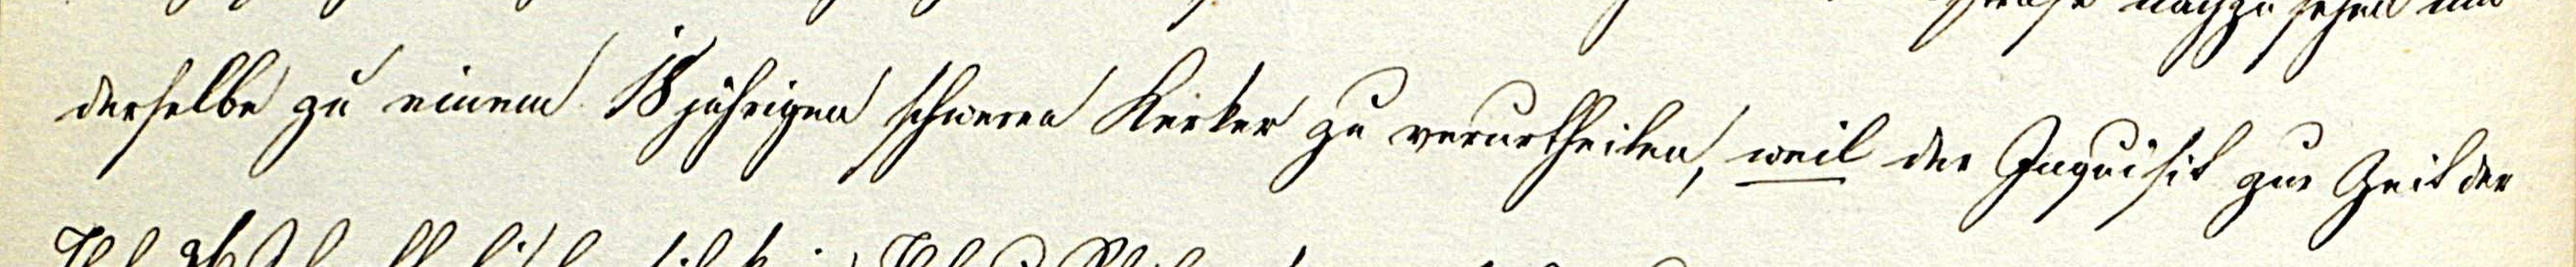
derselbe zu einem 18jährigen schweren Kerker zu verurtheilen, weil der Inquisit zur Zeit der
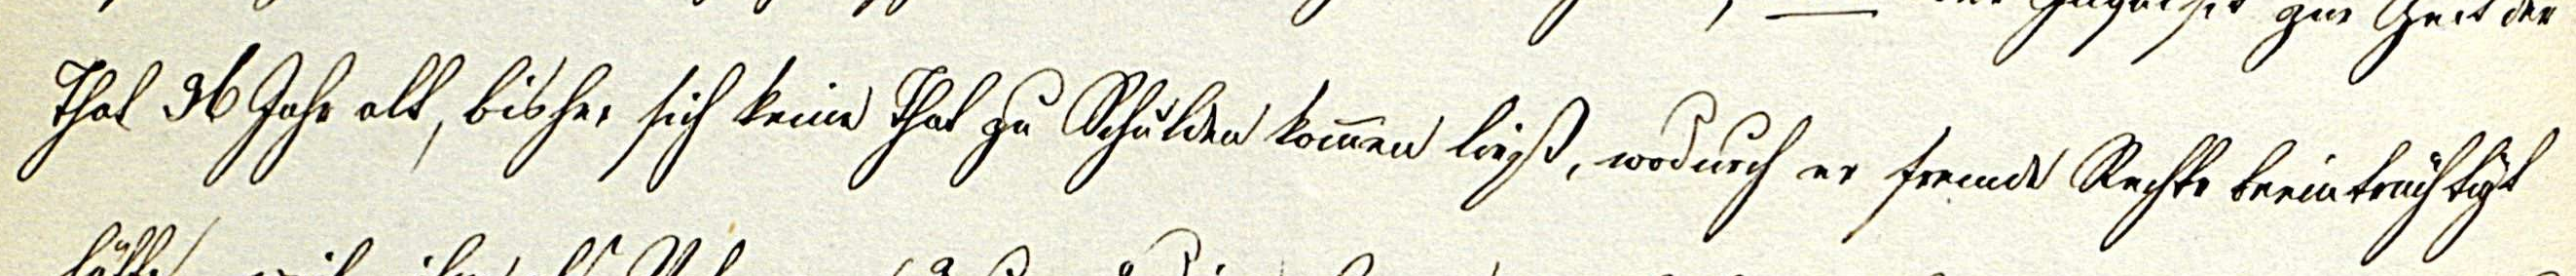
That 36 Jahr alt, bisher sich keine That zu Schulden kommen ließ, wodurch er fremde Rechte beeinträchtigt
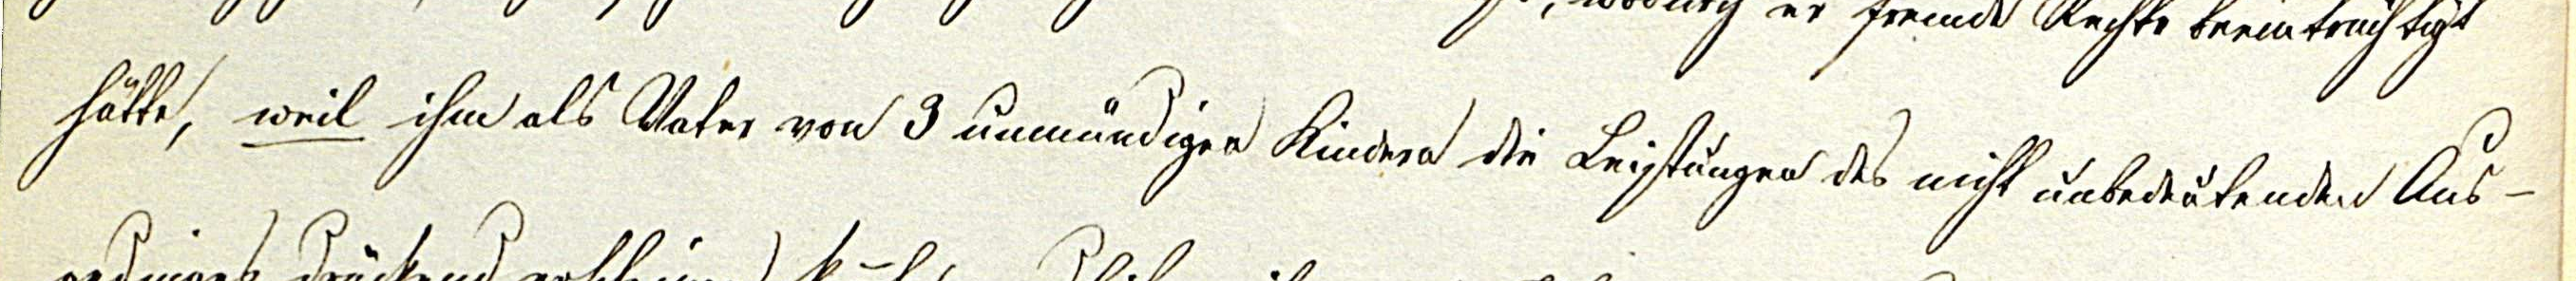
hätte, weil ihm als Vater von 3 unmündiger Kinder die Leistungen des nicht unbedeutenden Aus¬
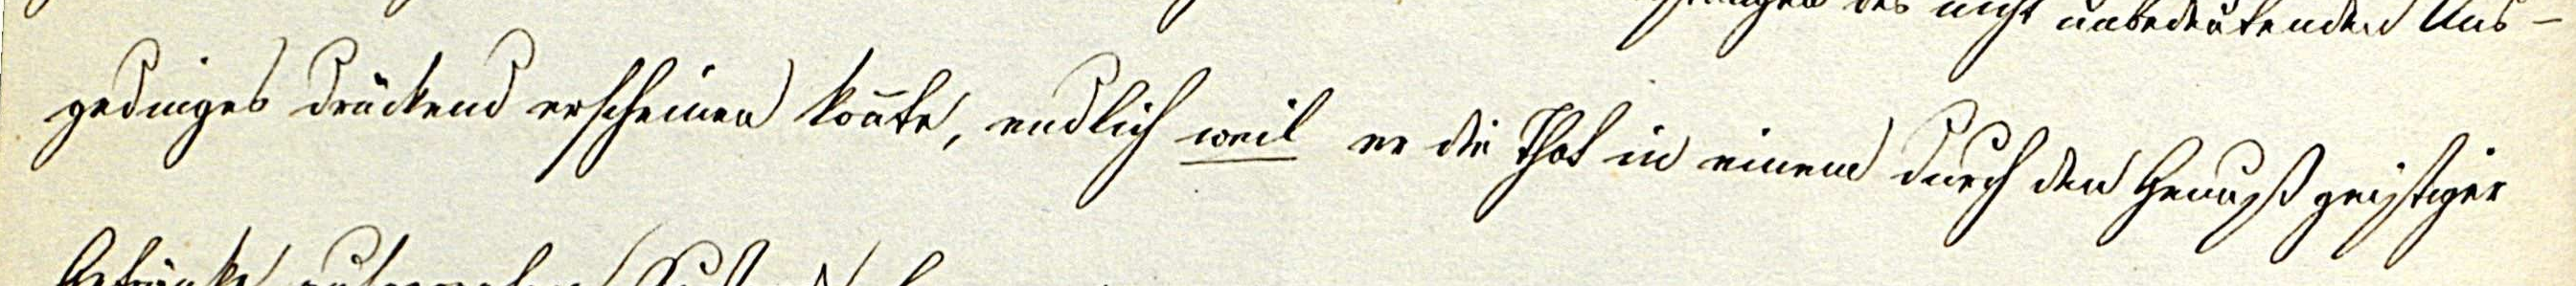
gedinges drückend erschienen konnte, endlich weil er die That in einem durch den Genuß geistiger
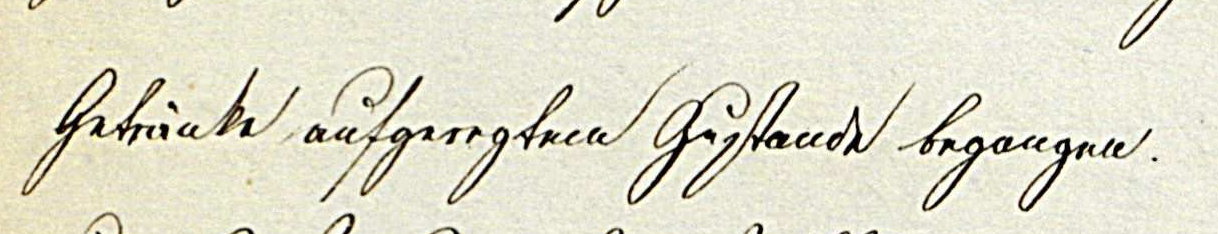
Getränke aufgeregten Zustande begangen.
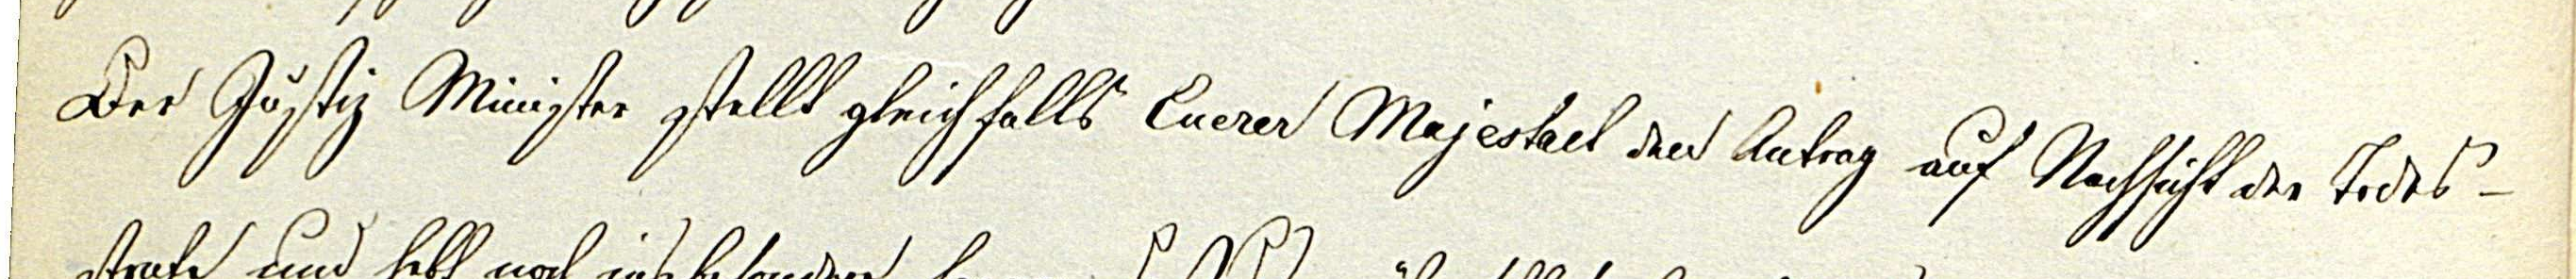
Der Justiz Minister stellt gleichfalls Euerer Majestät den Antrag auf Nachsicht der Todes¬
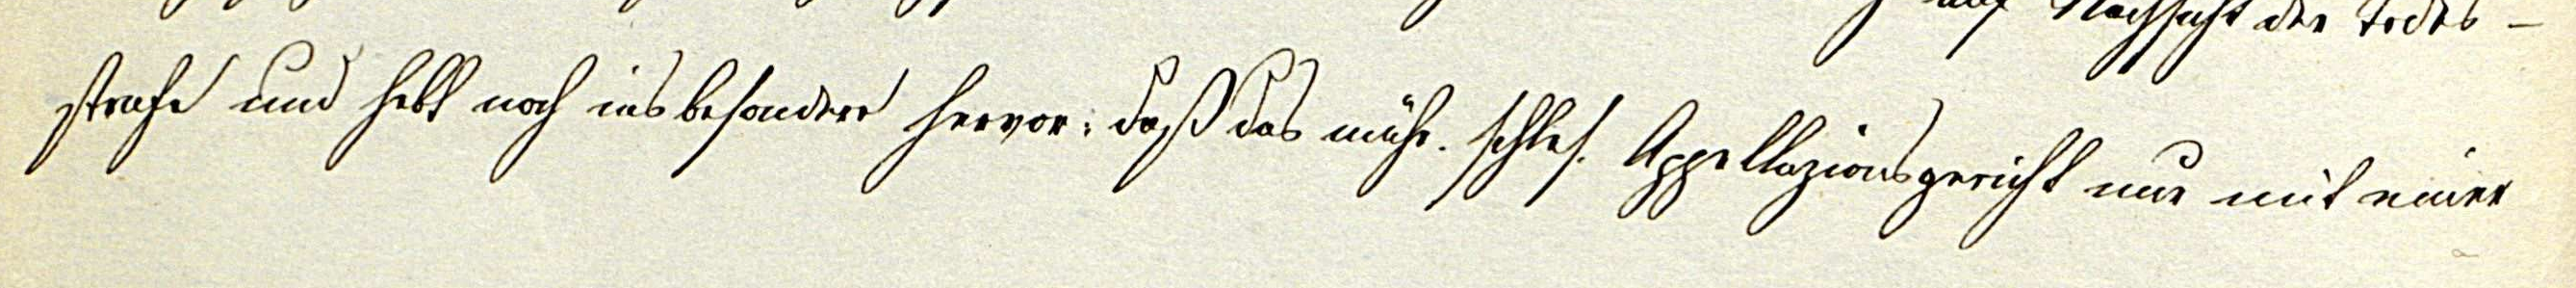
strafe und hebt noch insbesondere hervor, daß das mähr. schles. Appellazionsgericht nur mit einer
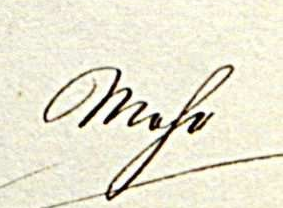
mehr
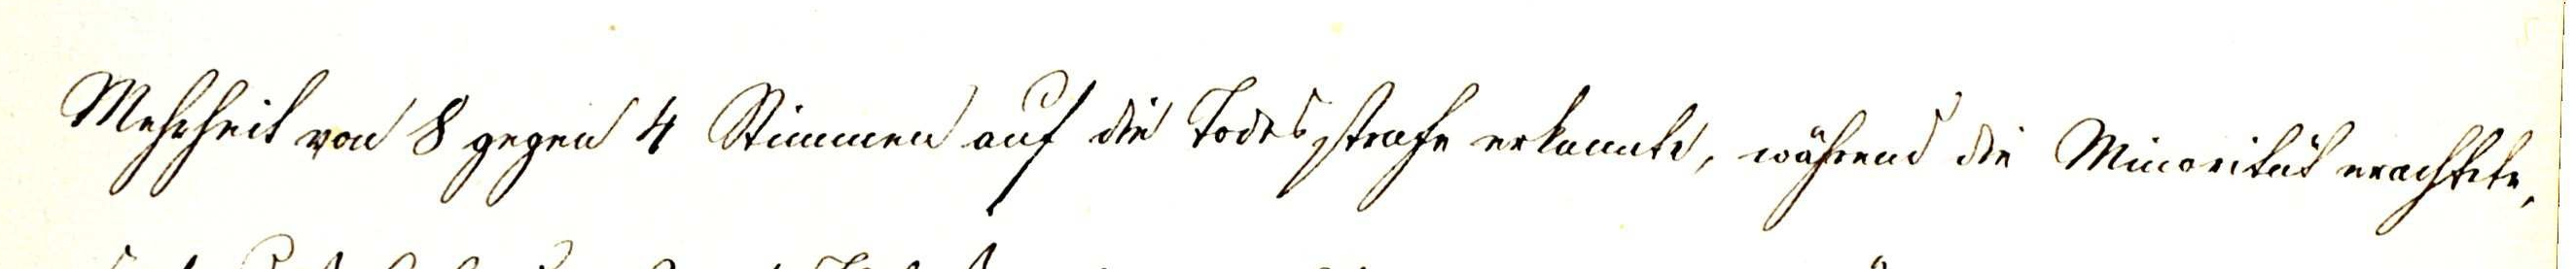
Mehrheit von 8 gegen 4 Stimmen auf die Todesstrafe erkannte, während die Minorität erachtete
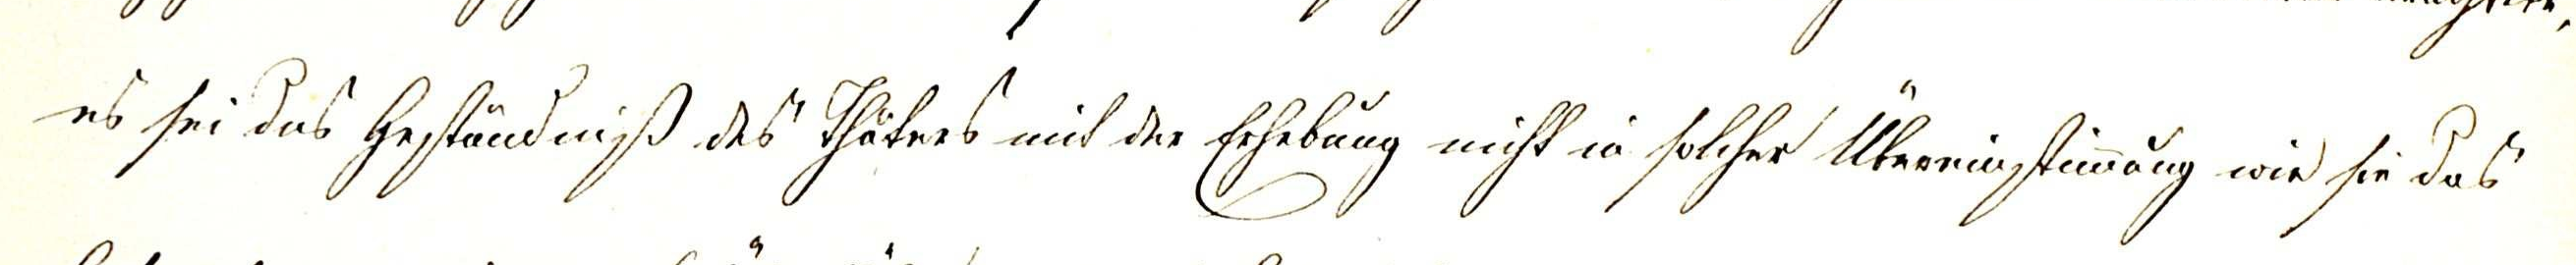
es sei das Geständniß des Thäters mit der Erhebung nicht in solcher Übereinstimmung wie sie das
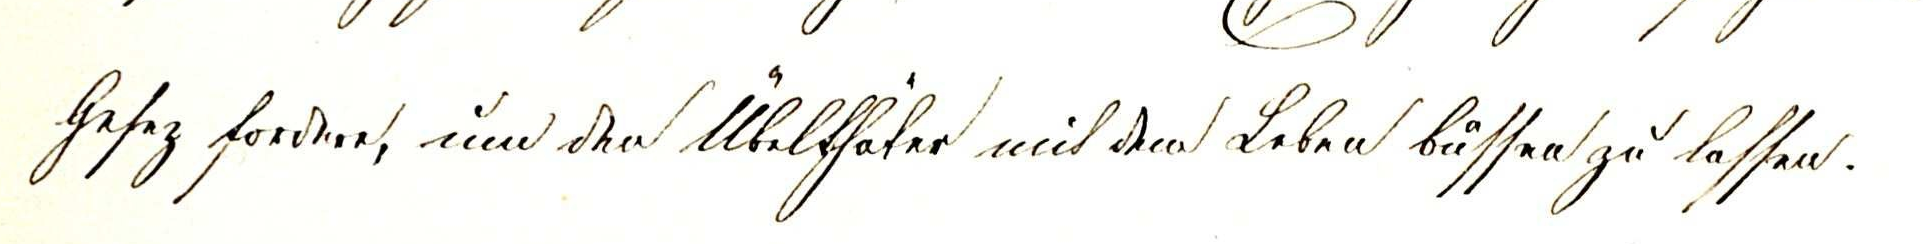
Gesez fordern, um den Übelthäter mit dem Leben büssen zu lassen
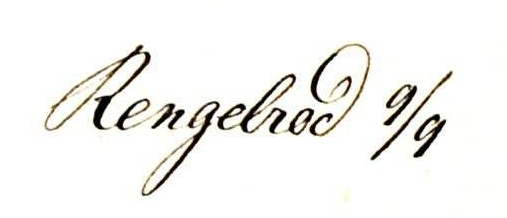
Rengelrod 9/9
